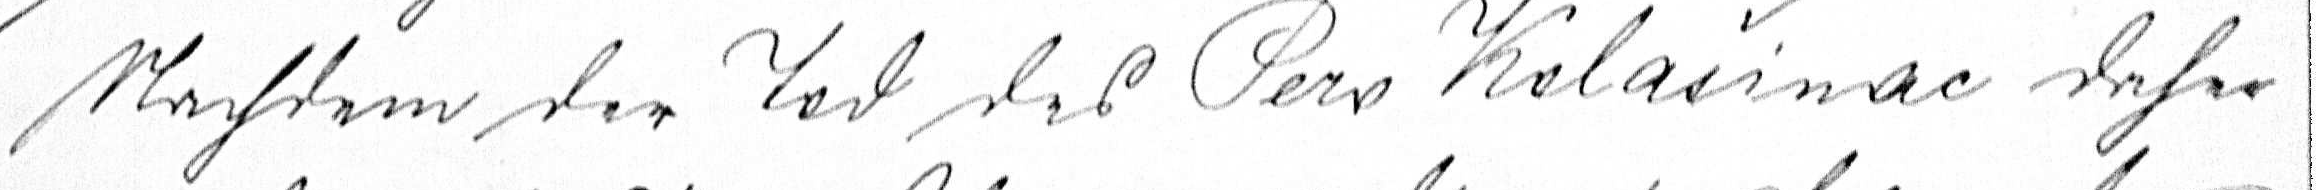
Nachdem der Tod des Pero Kolašinac daher
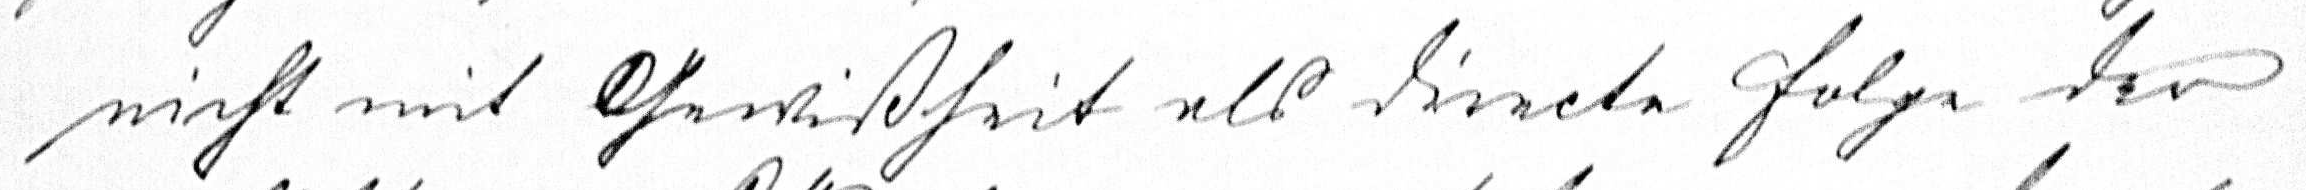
nicht mit Gewißheit als directe Folge der
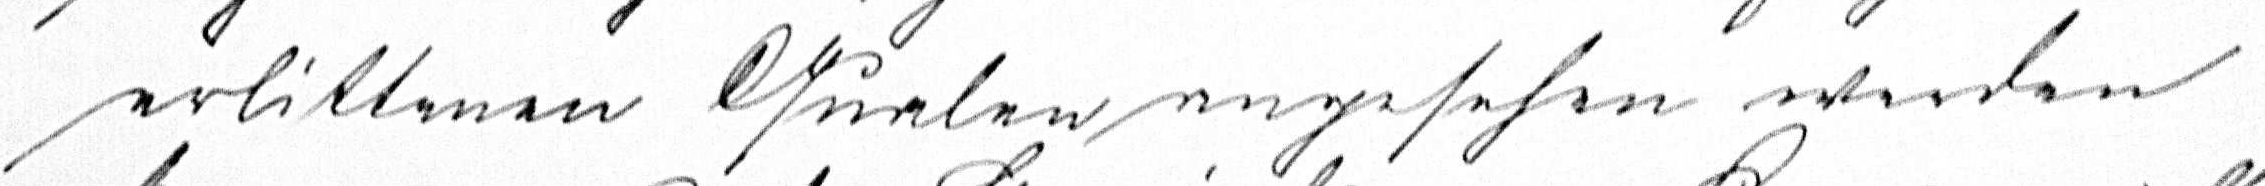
erlittenen Qualen angesehen werden
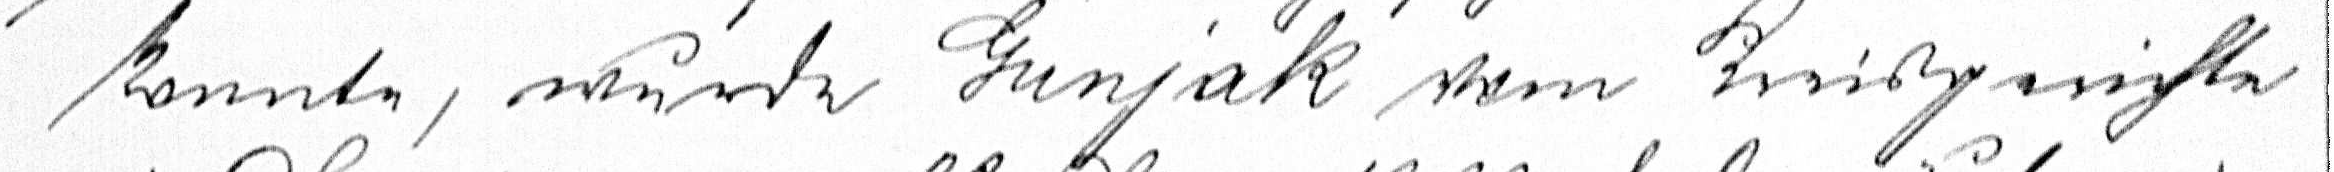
konnte, wurde Gunjak vom Kreisgerichte
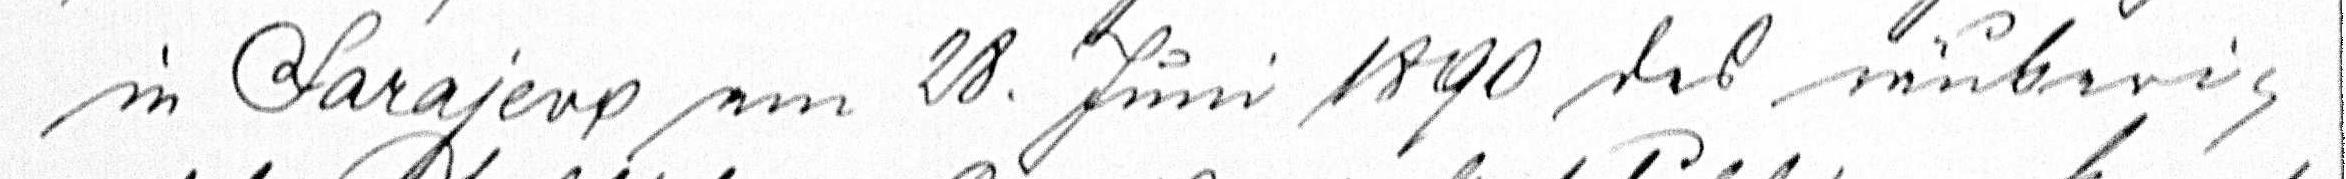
in Sarajevo am 28. Juni 1890 des räuberi¬
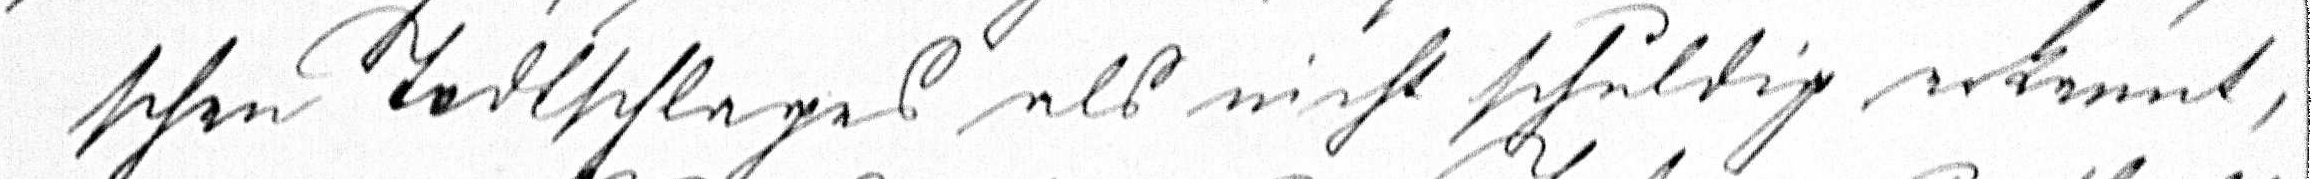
schen Todtschlages als nicht schuldig erkannt,
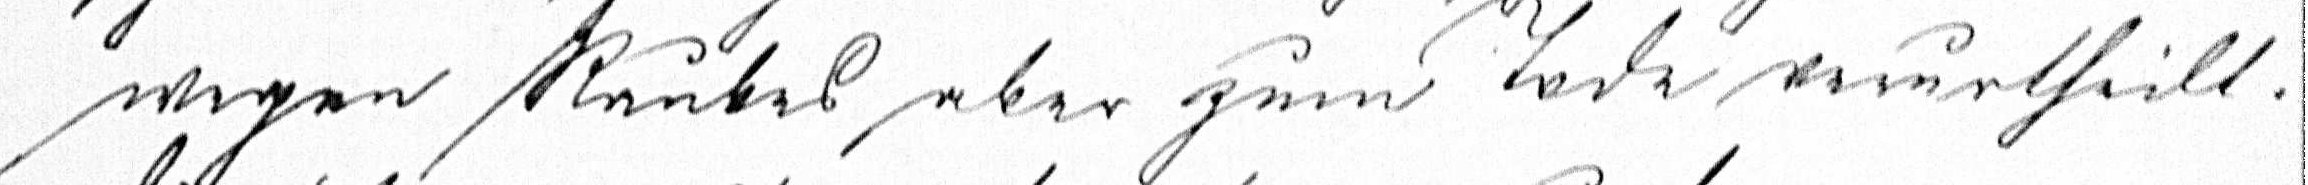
wegen Raubes aber zum Tode verurtheilt.
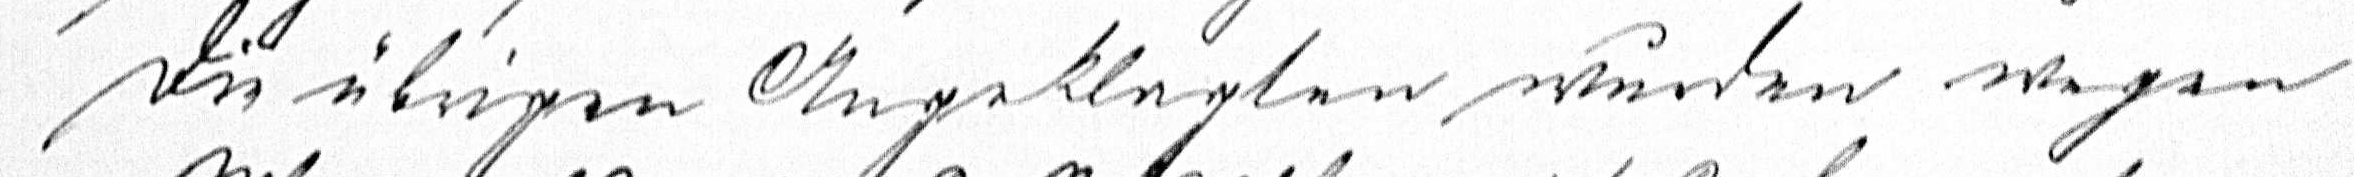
Die übrigen Angeklagten wurden wegen
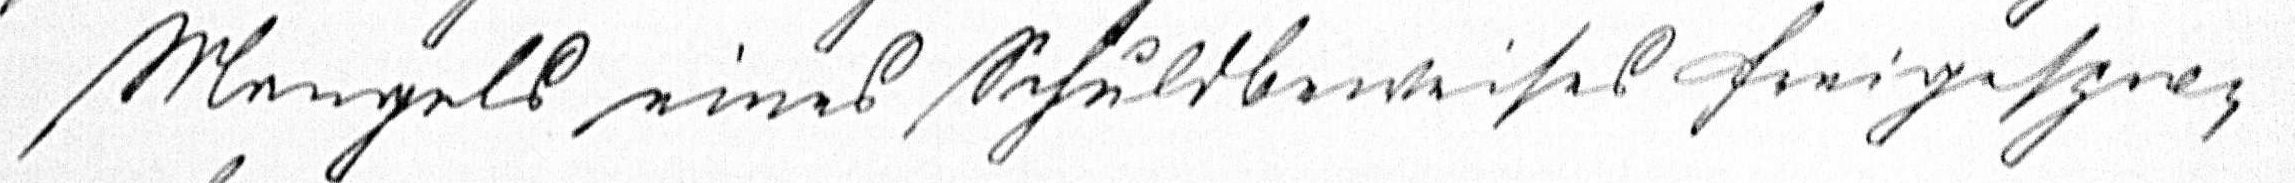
Mangels eines Schuldbeweises freigespro¬
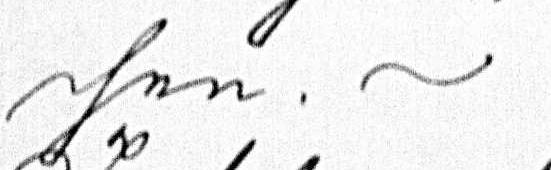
chen.
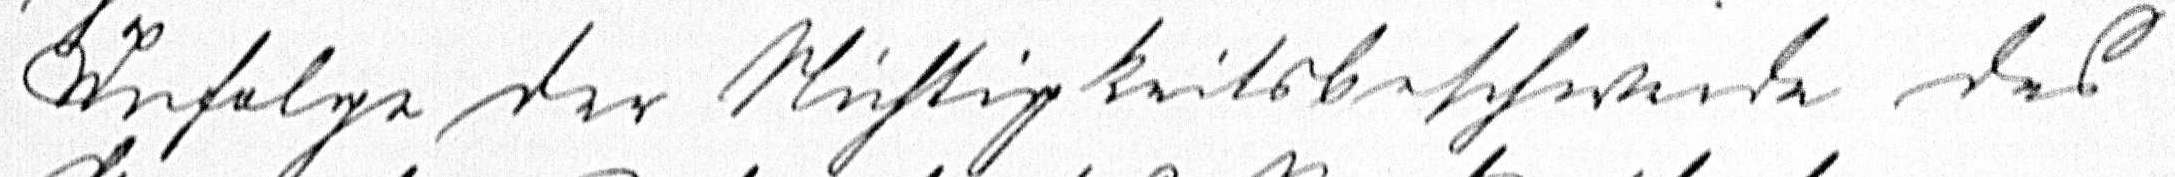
Infolge der Nichtigkeitsbeschwerde des
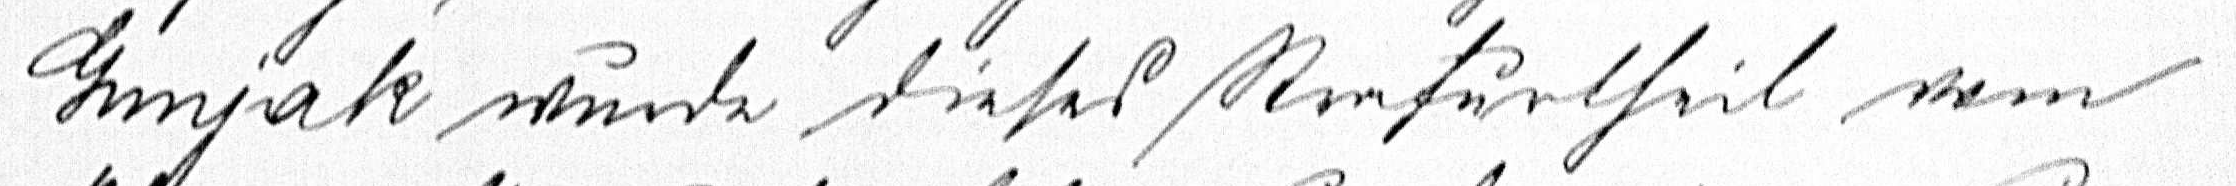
Gunjak wurde dieses Strafurtheil vom
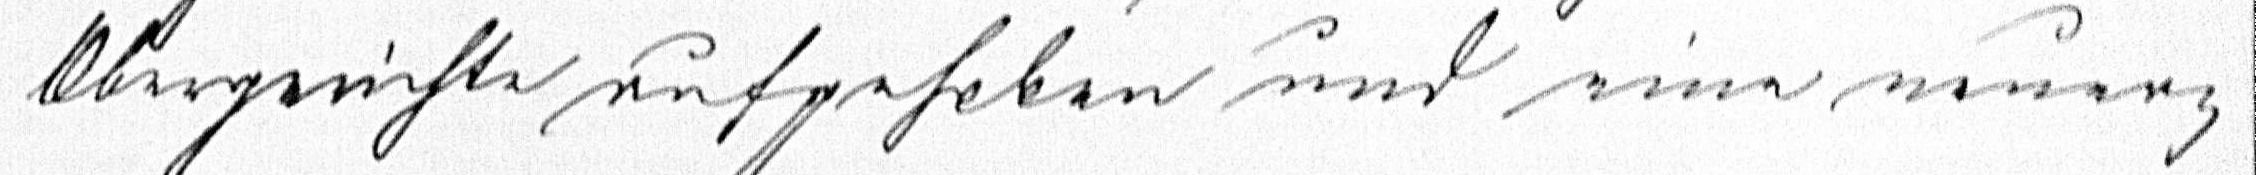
Obergerichte aufgehoben und eine neuer¬
